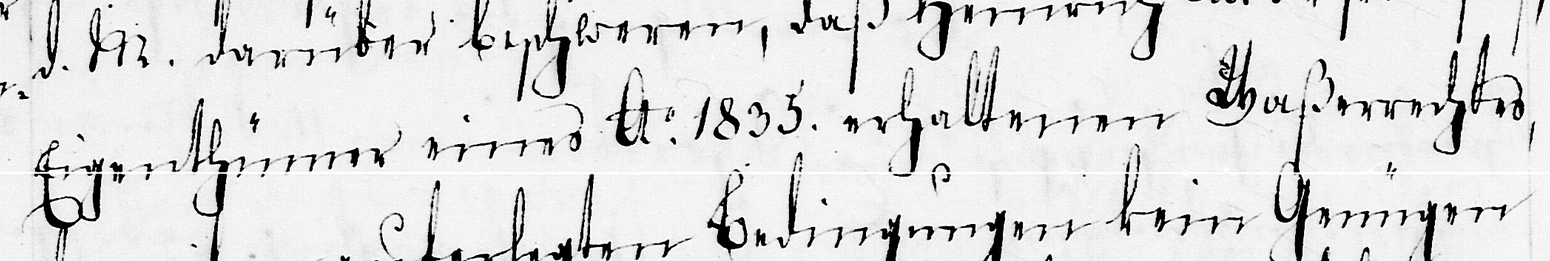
Eigenthümer eines Ao. 1835. erhaltenen Waßerrechtes,
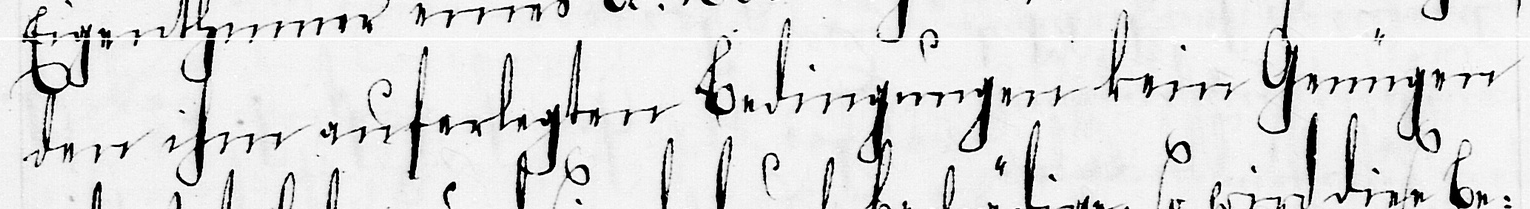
den ihm auferlegten Bedingungen kein Genügen
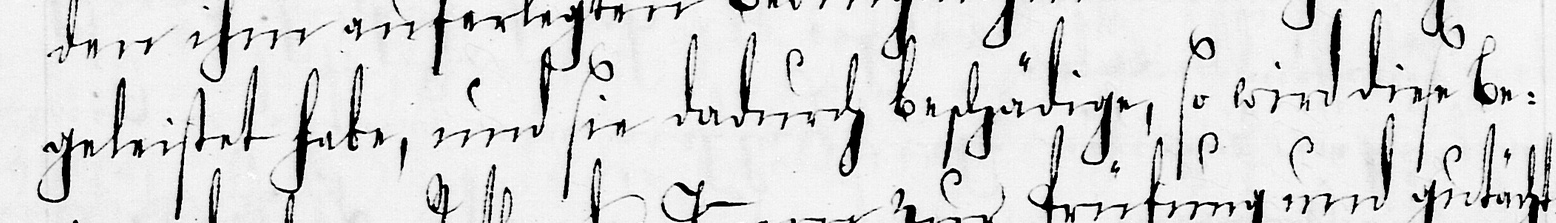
geleistet habe, und sie dadurch beschädige, so wird diese Be¬
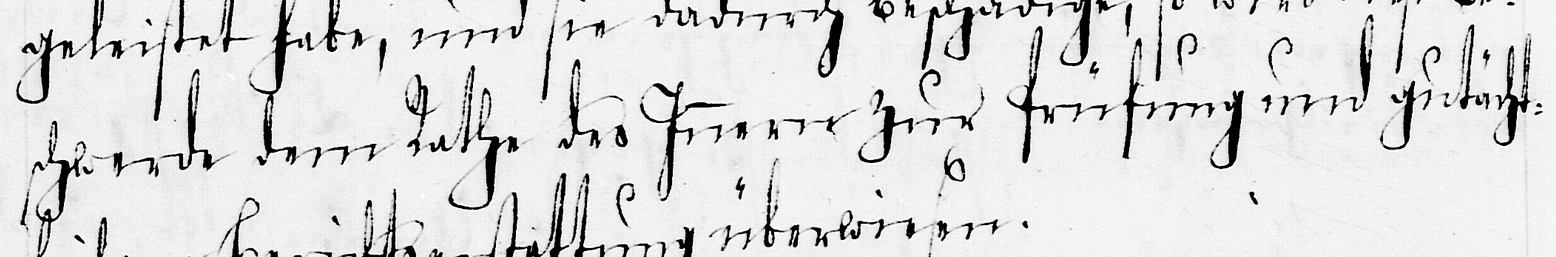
schwerde dem Rathe des Innern zur Prüfung und gutäch¬
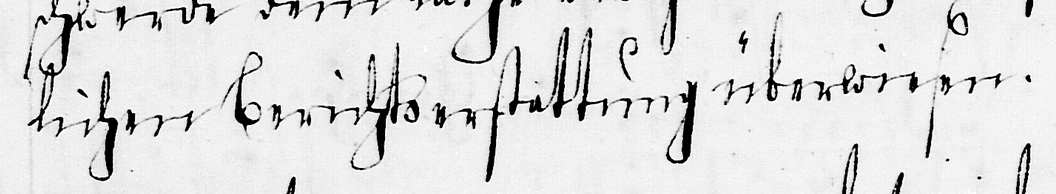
tlichen Berichtserstattung überwiesen.
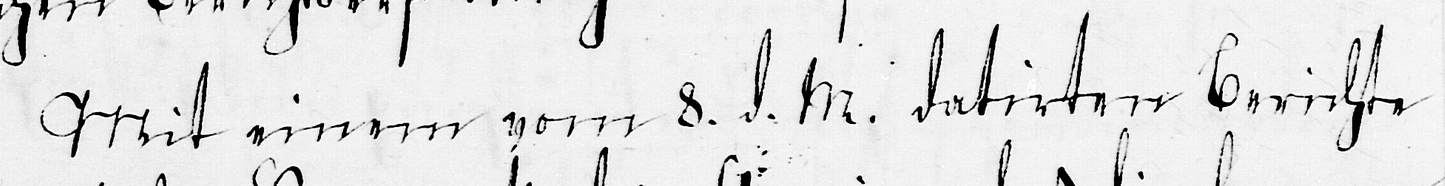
Mit einem vom 8. d. M. datirten Berichte
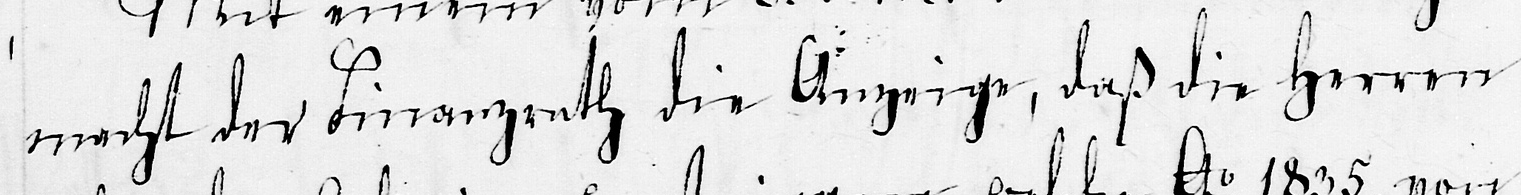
macht der Finanzrath die Anzeige, daß die Herren
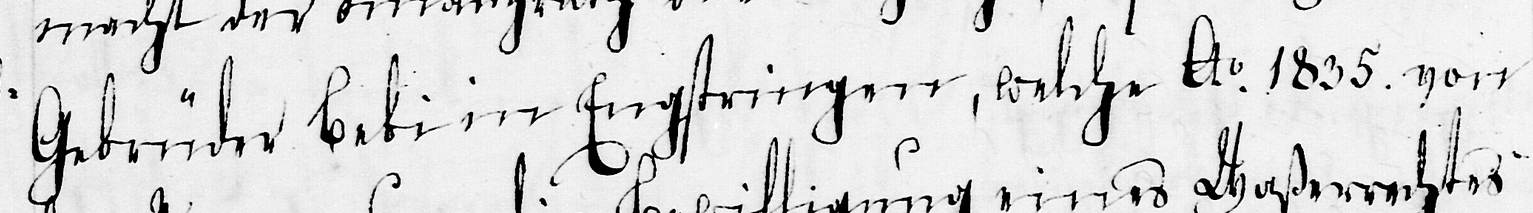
Gebrüder Bebi in Engstringen, welche Ao. 1835. von
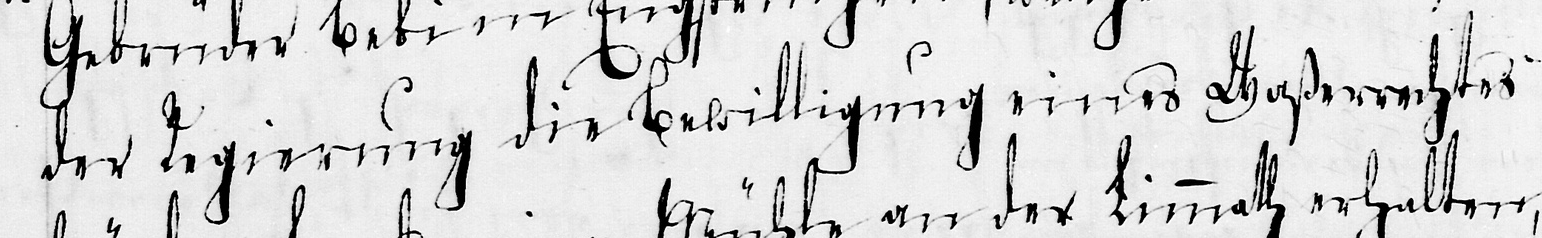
der Regierung die Bewilligung eines Waßerrechtes
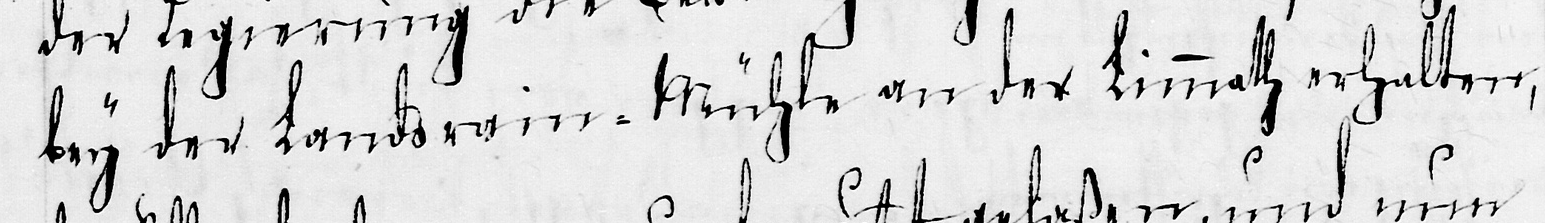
bey der Landsrain-Mühle an der Limmath erhalten,
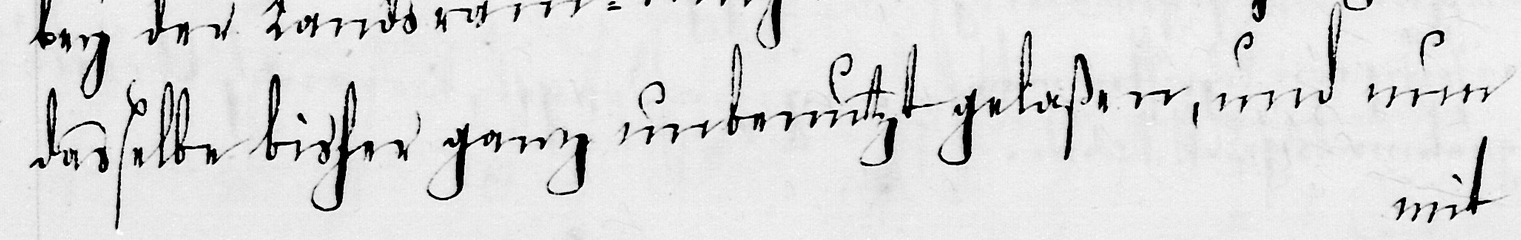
dasselbe bisher ganz unbenutzt gelaßen, und nun
